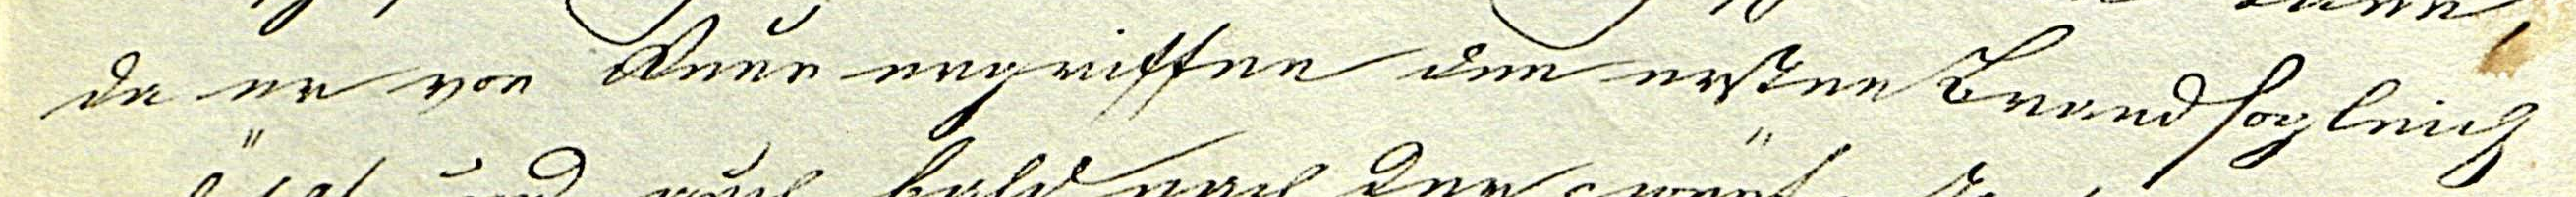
da er von Reue ergriffen den ersten Brand sogleich
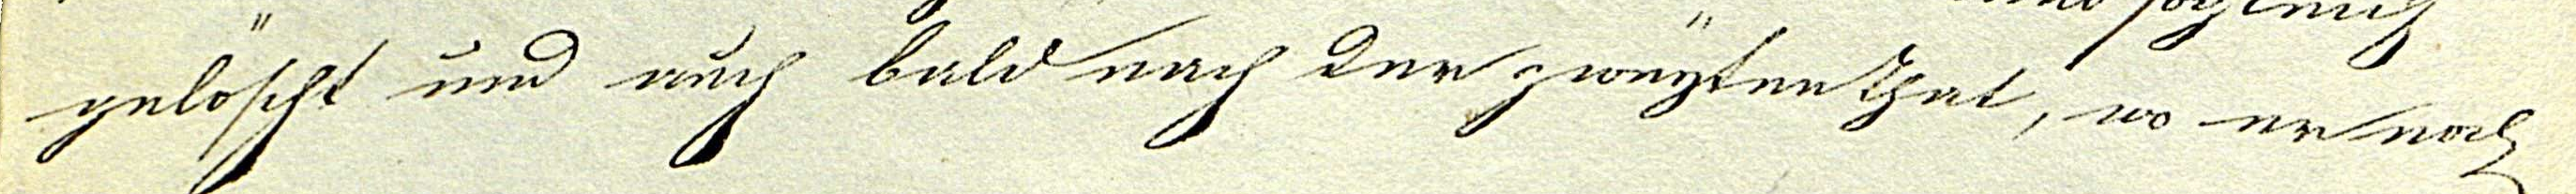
gelöscht und auch bald nach der zweyten That, wo er noch
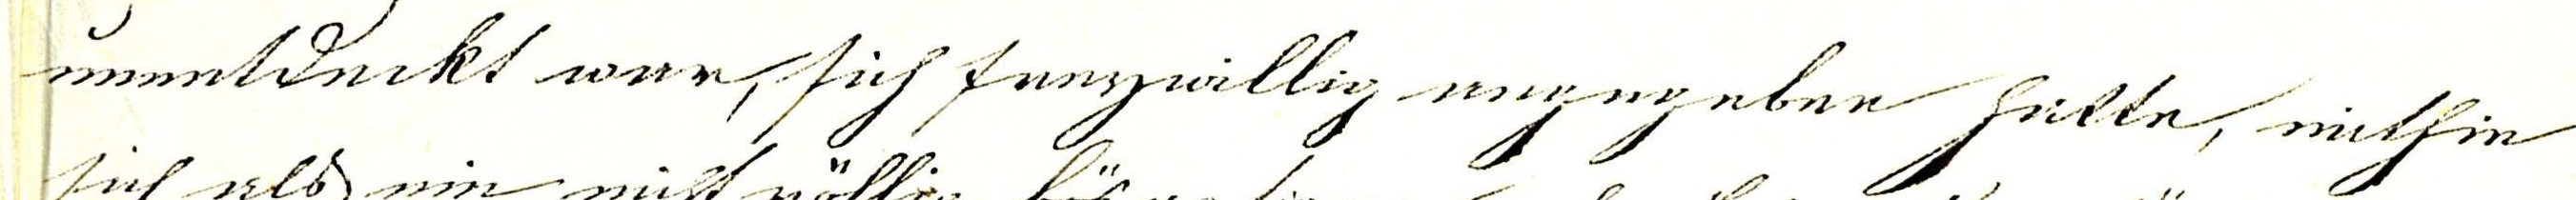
unentdeckt war, sich freywillig angegeben hatte, nichthin
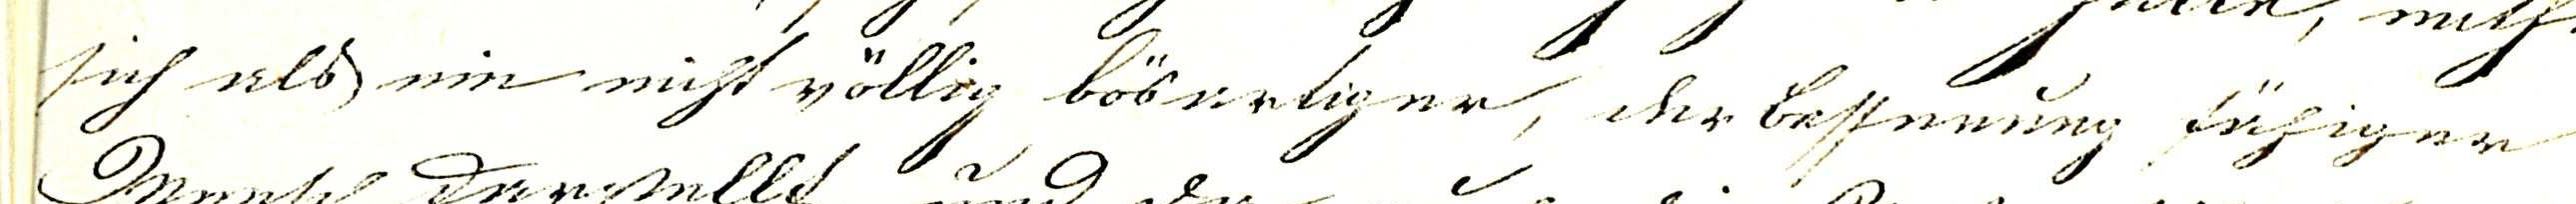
sich als ein nicht völlig bösartiger, der Besserung fähiger
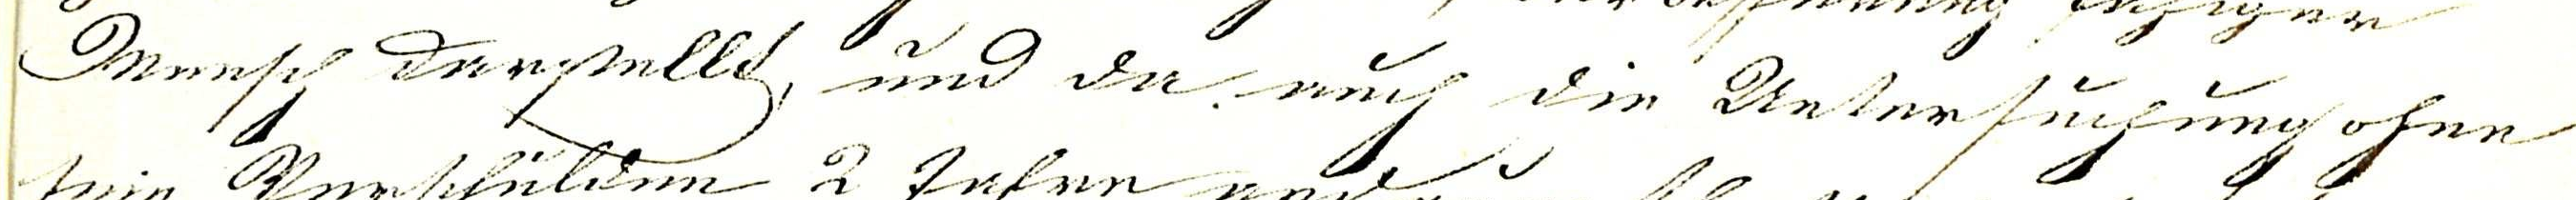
Mensch derstellt, und da auch die Untersuchung ohne
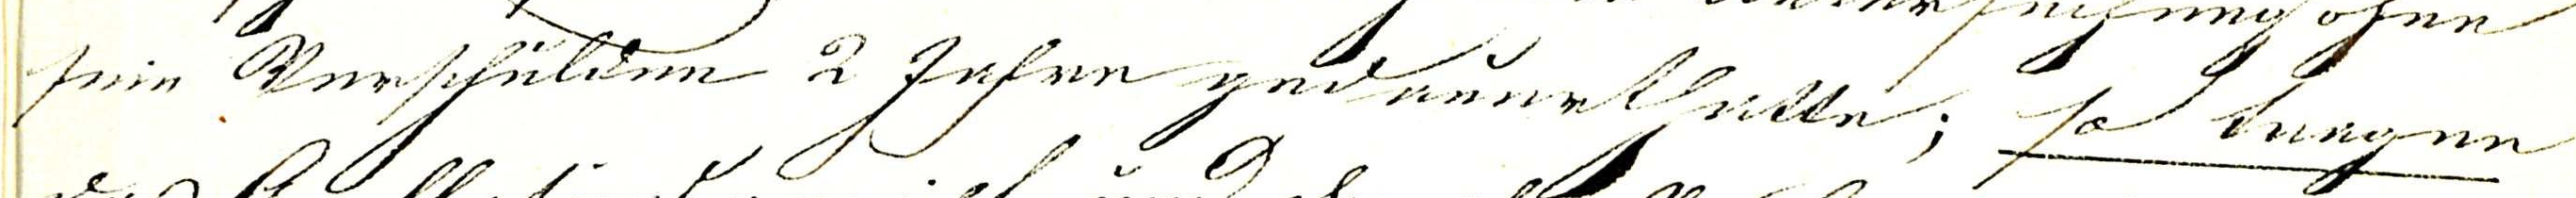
sein Verschulden 2 Jahre gedauert hatte; so tragen
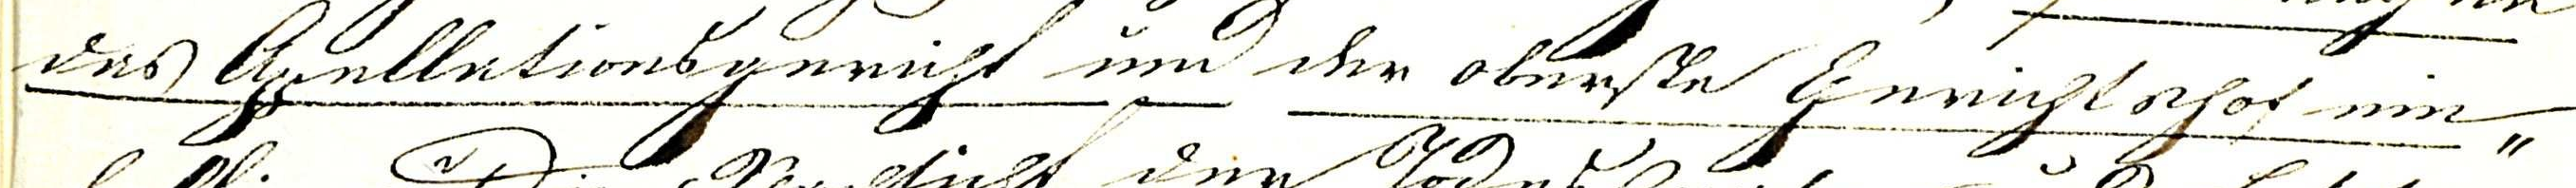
das Appellationsgericht und der oberste Gerichtshof ein¬
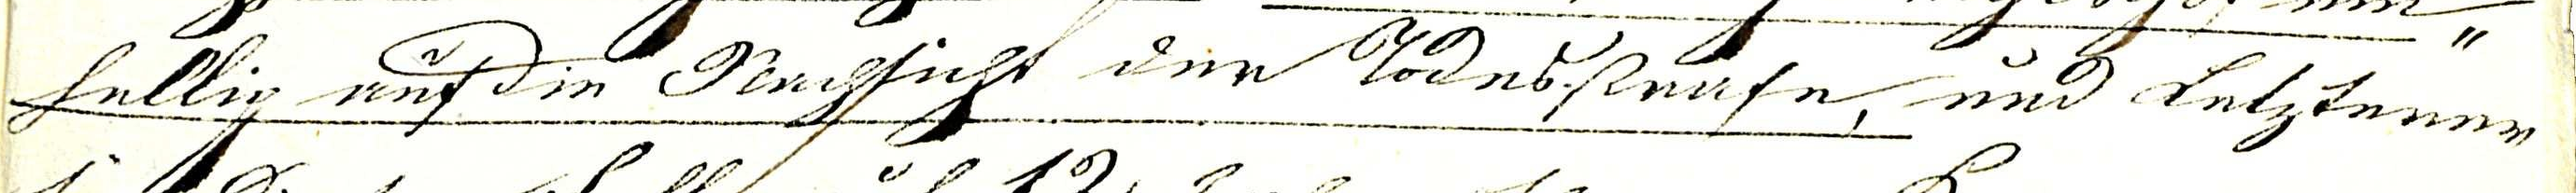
hellig auf in Nachsicht der Todesstrafe, und Letzterer
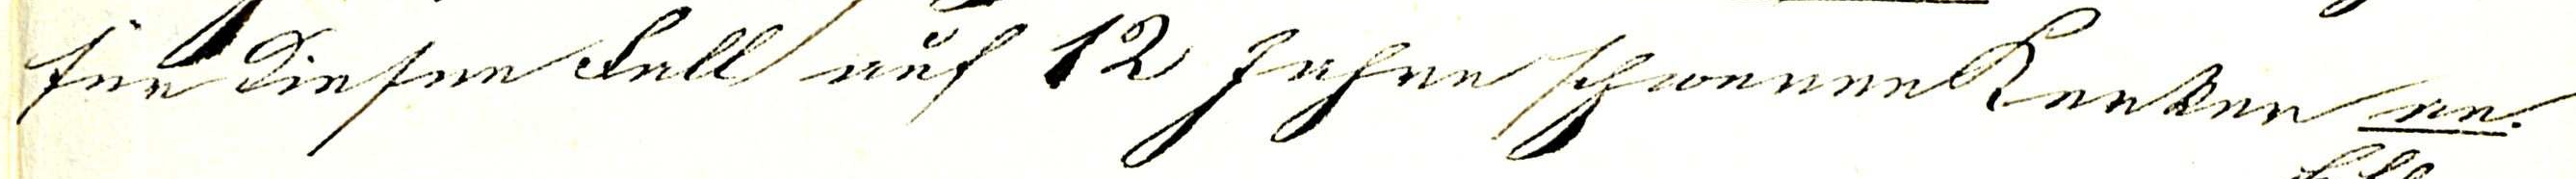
für diesen Fall auf 12 Jahre schweren Kerker an.
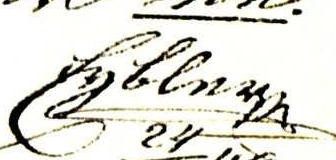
Eybler
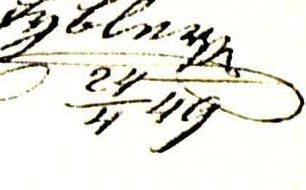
24/4 49
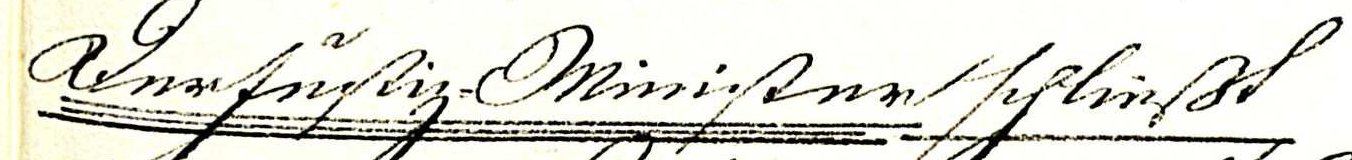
Der Justiz-Minister schließt
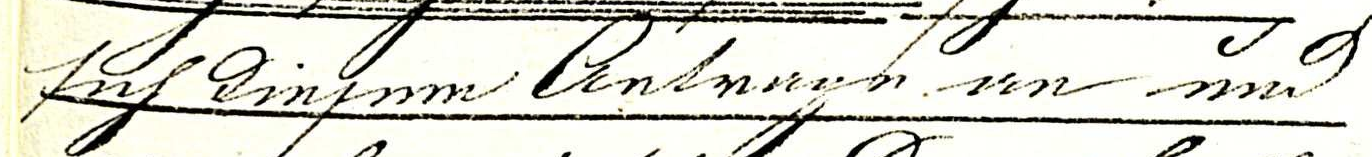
sich diesem Antrage an und
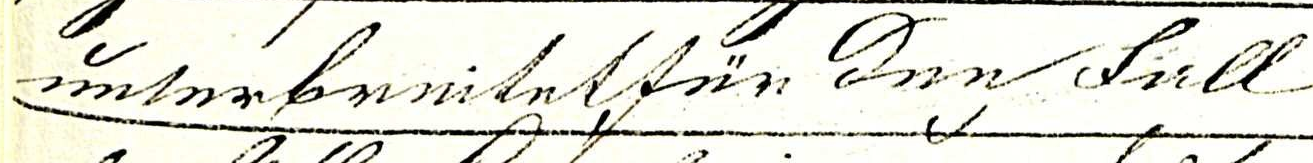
unterbreitet für den Fall
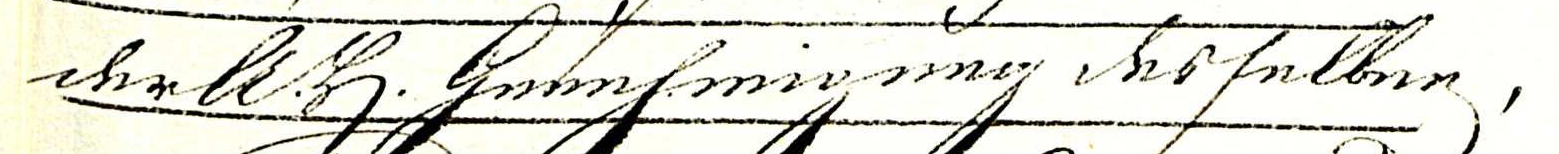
der A.H. Genehmigung desselben,
